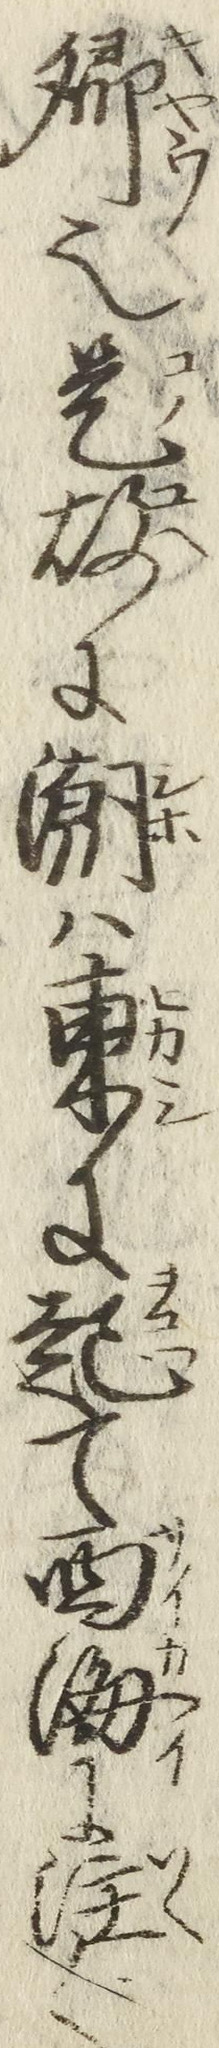郷也是故に潮は東に起て西海に注ぐ
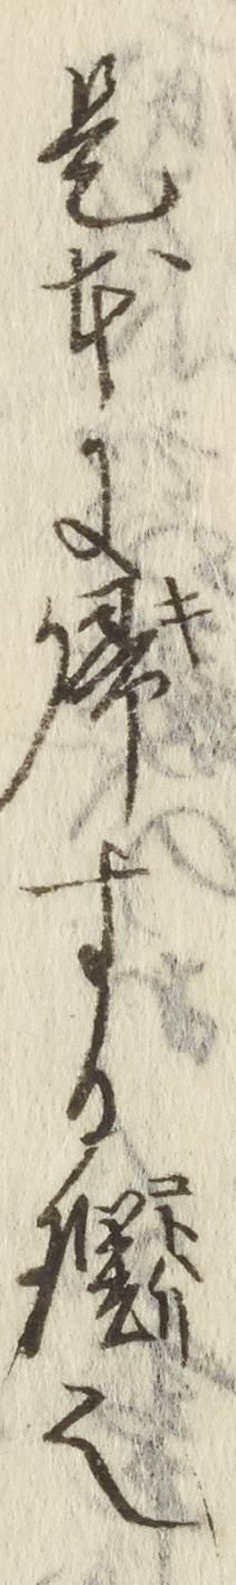是本に帰する理也
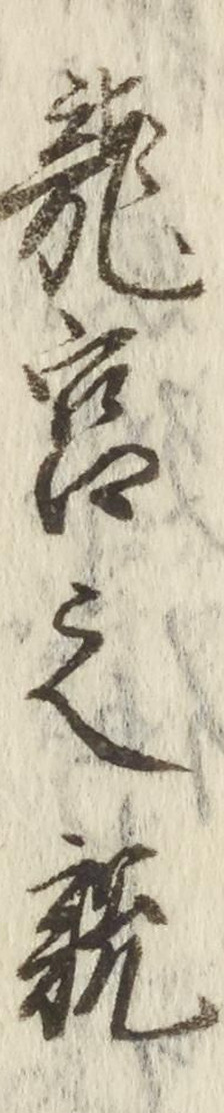龍宮の説
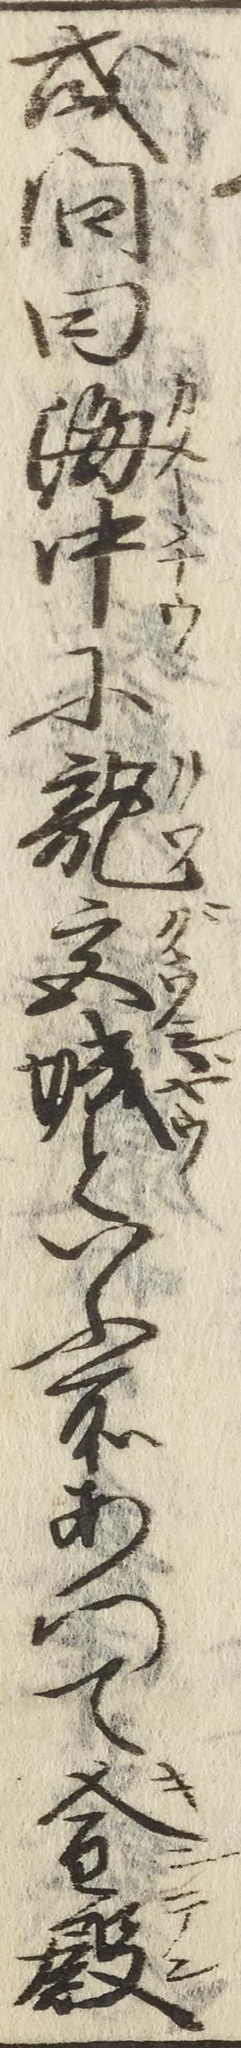或問曰海中に龍宮城といふ所あつて金殿

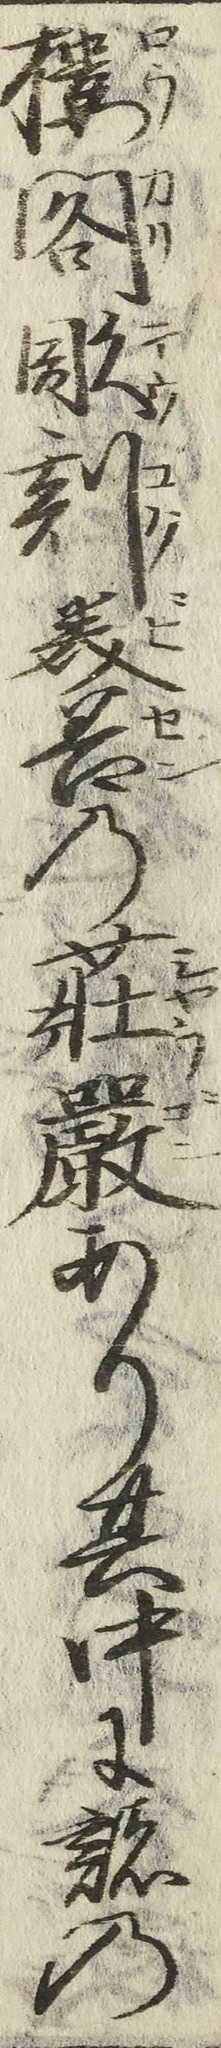楼閣彫刻美善の荘厳あり其中に諸の
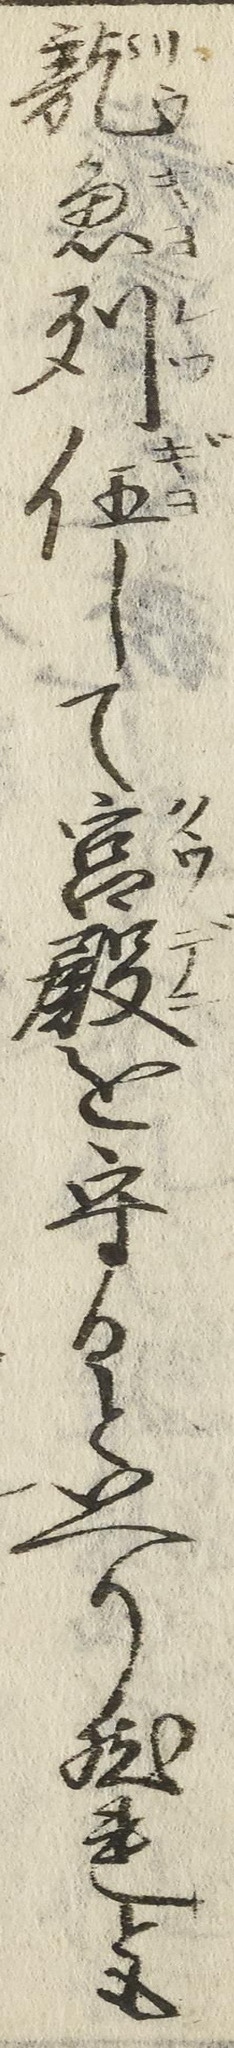龍魚列伍して宮殿を守るといへり然れとも
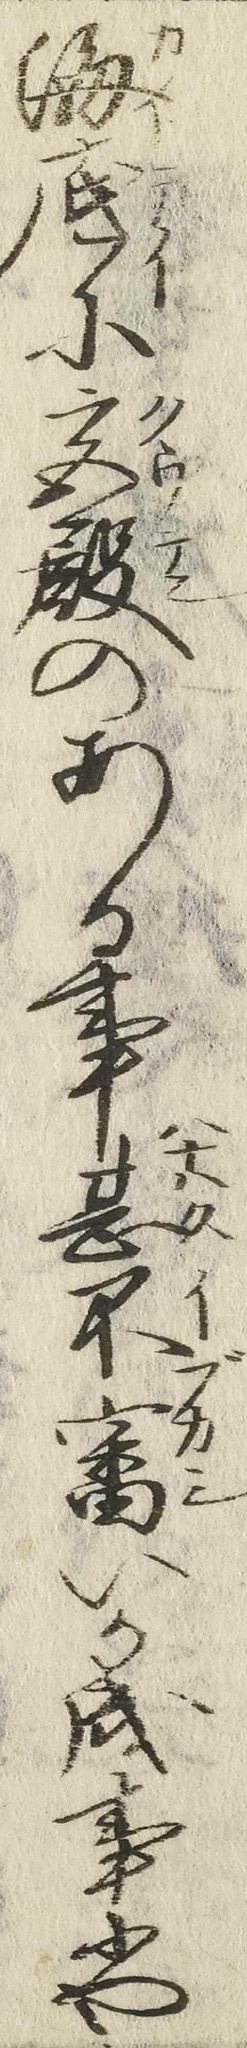海底に宮殿のある事甚不審いか成事にや
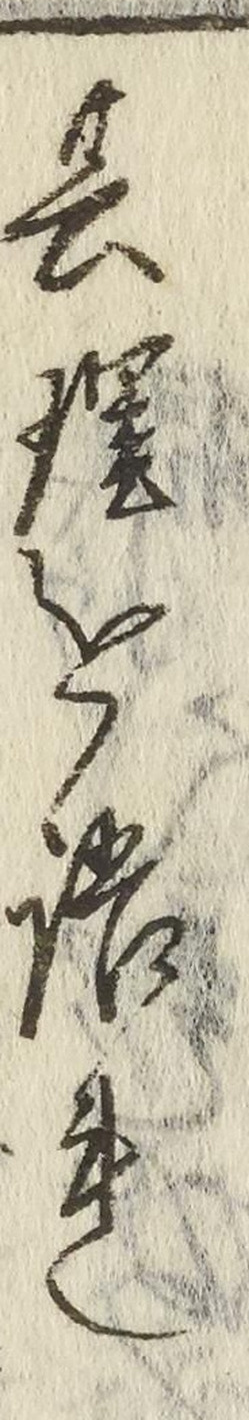其理を語れ
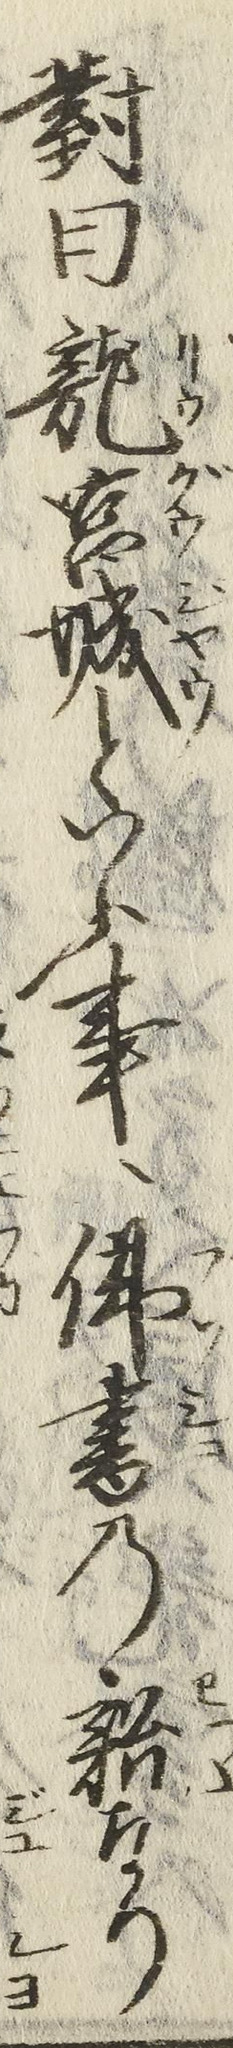対曰龍宮城といふ事、佛書の説なり
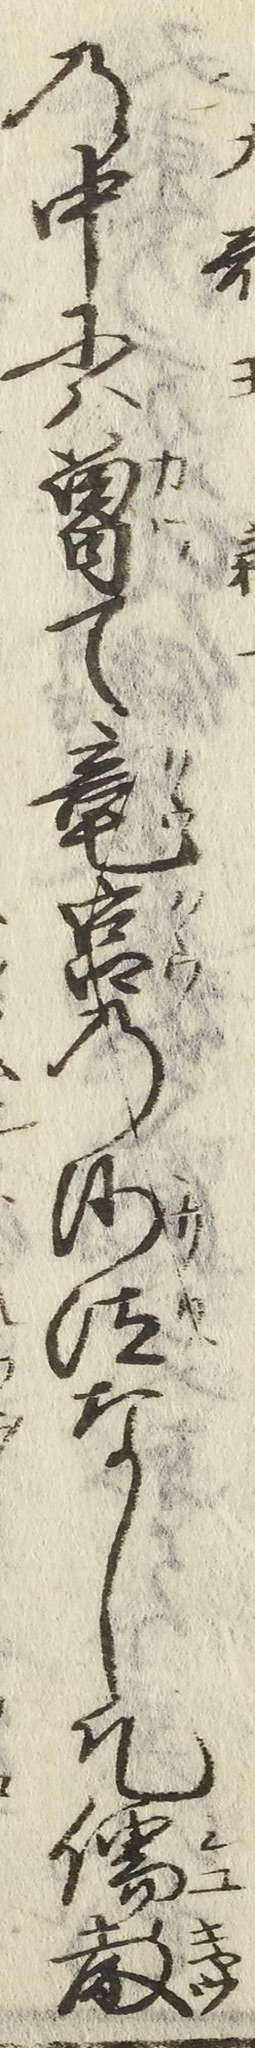の中には曽て竜宮の沙汰なし凡儒教
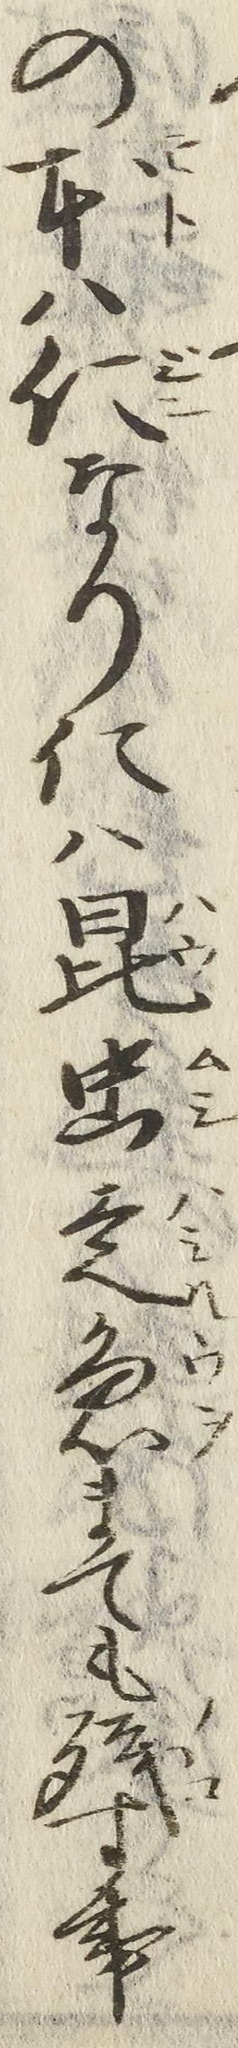の本は仁なり仁は昆虫走魚まても残す事
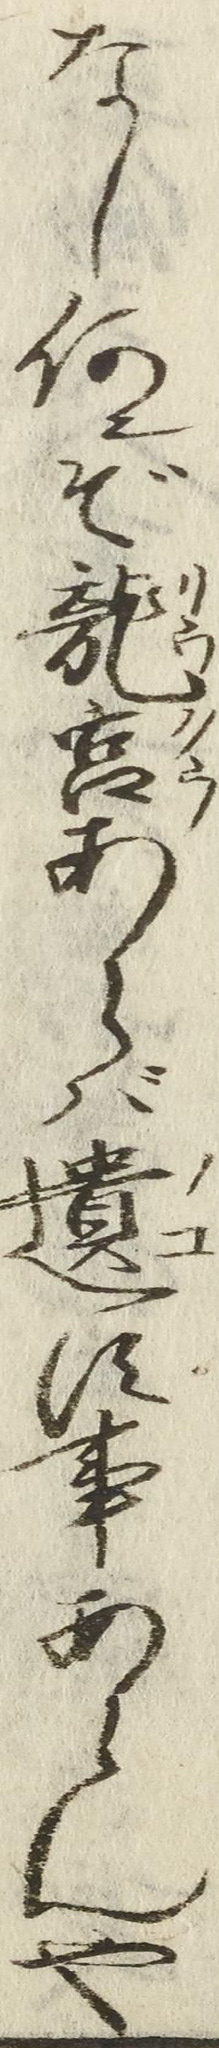なし何んぞ龍宮あらば遺す事あらんや
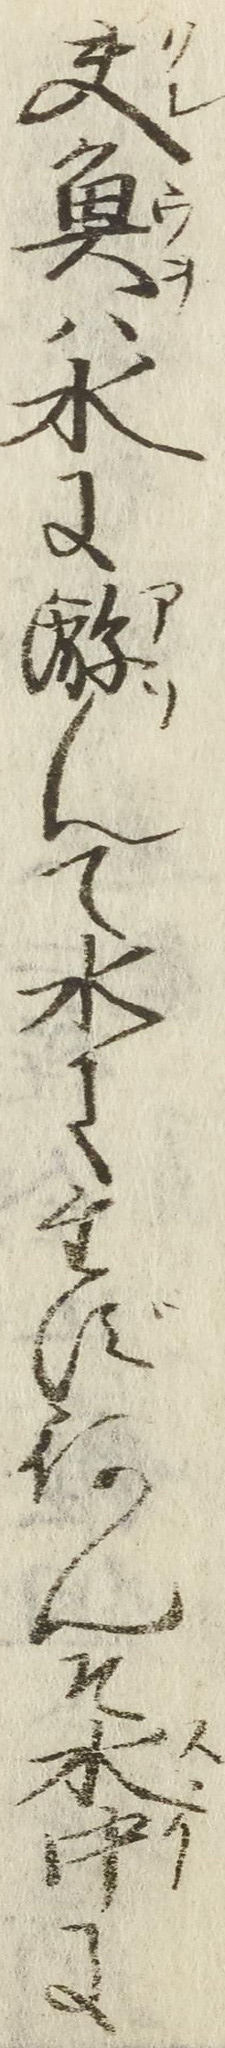夫魚は水に遊んて水に生ず何んそ水中に
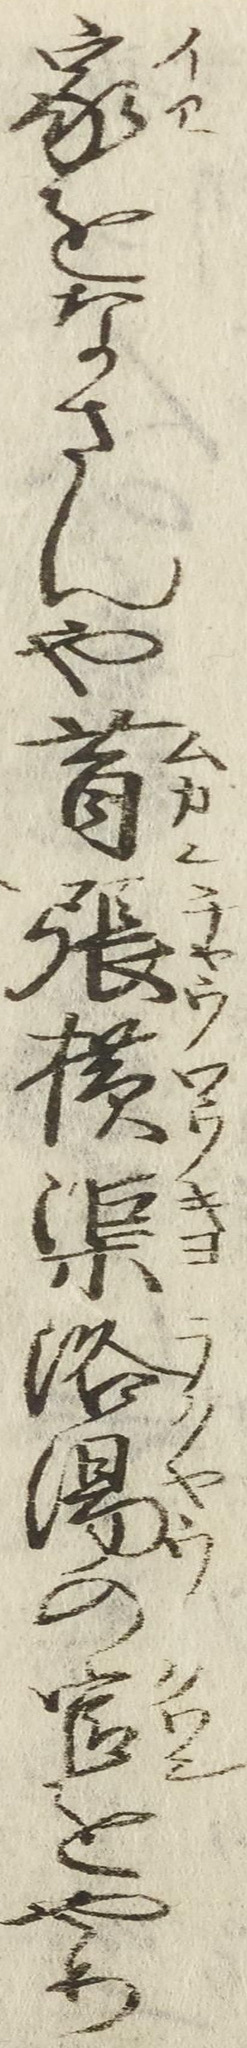家をなさんや昔張横渠洛陽の官をやめ
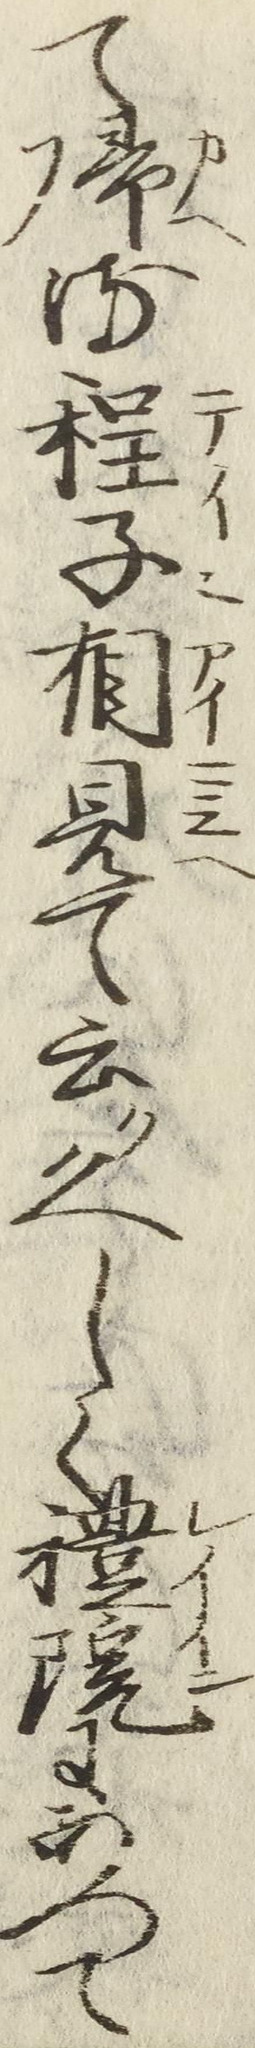て帰る程子相見て云ク久しく禮院にあつて
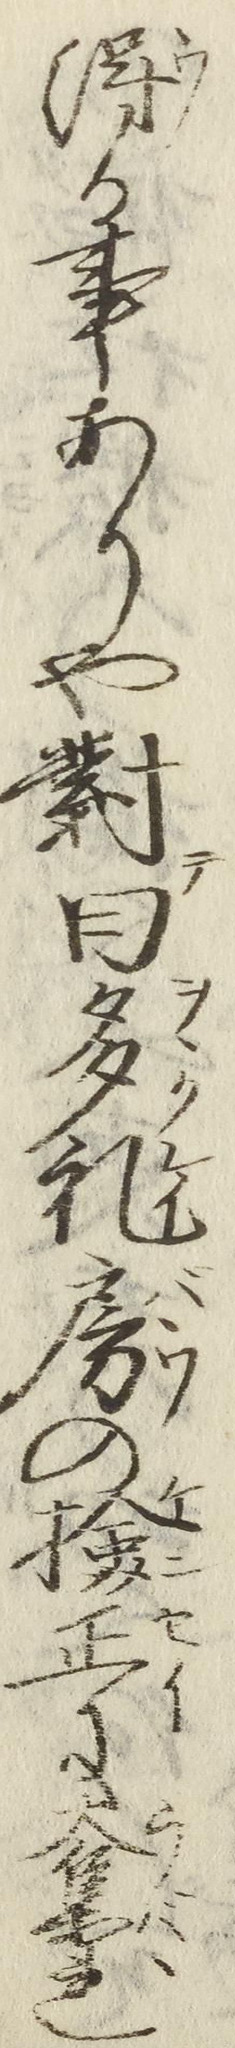得る事ありや対テ曰多礼房の検正に奪れ
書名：天地或問珍　天
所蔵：東京大学地震研究所図書室 Earthquake Research Institute Library, The University of Tokyo, JAPAN
